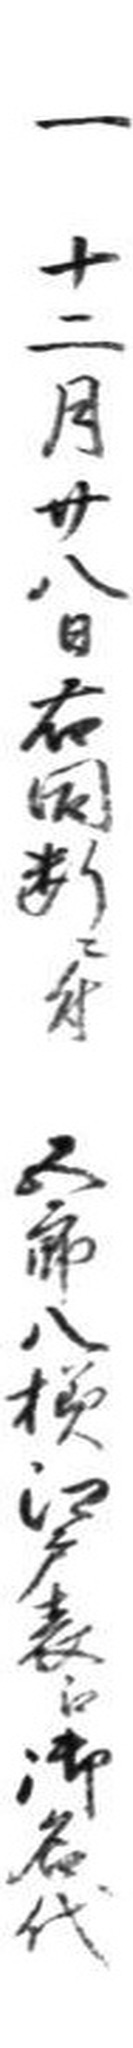一十二月廿八日右同断ニ付五郎八様江戸表江御名代
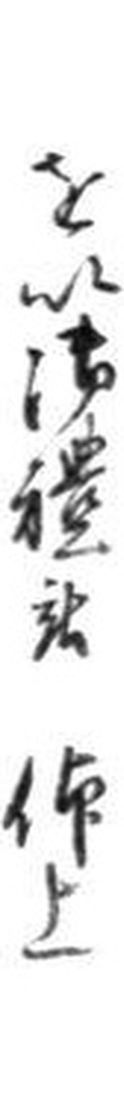を以御礼被仰上
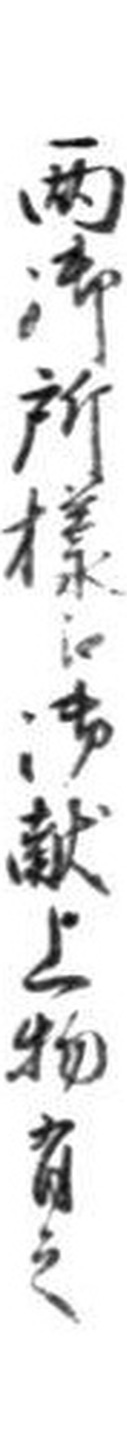両御所様江御献上物有之
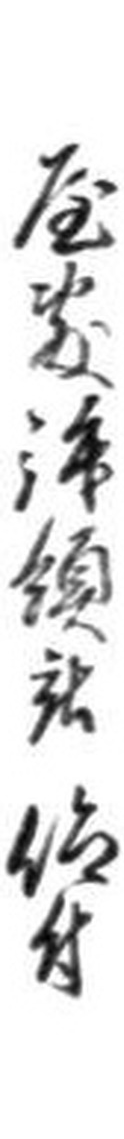屋敷拝領被仰付
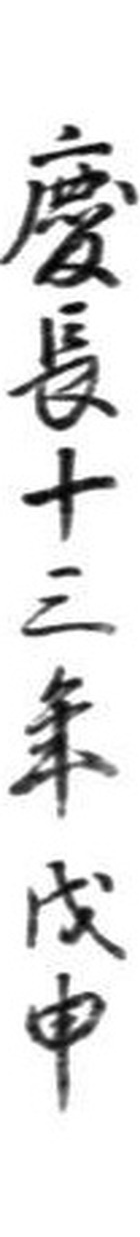慶長十三戊申
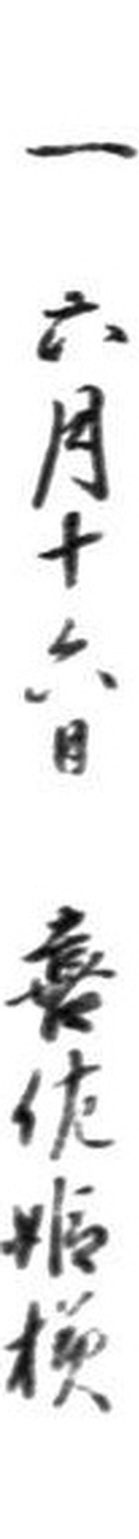一六月十六日喜佐姫様
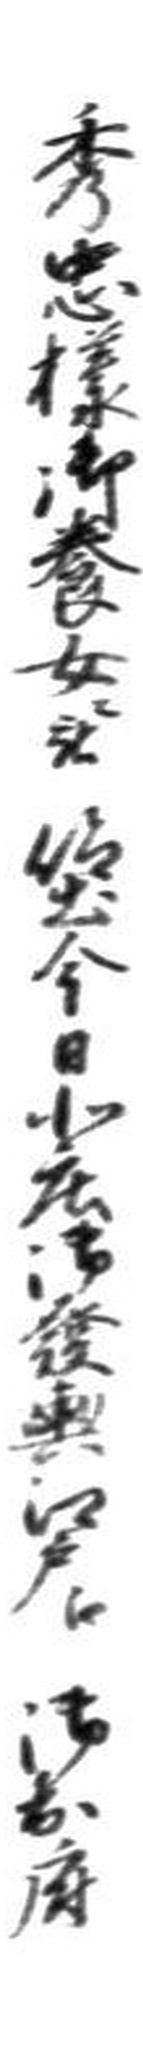秀忠様御養女ニ被仰出今日北庄御発輿江戸江御出府
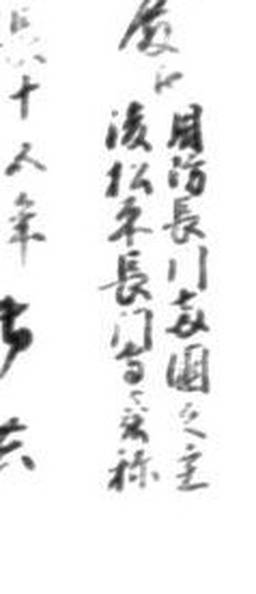後松平長門守与被称
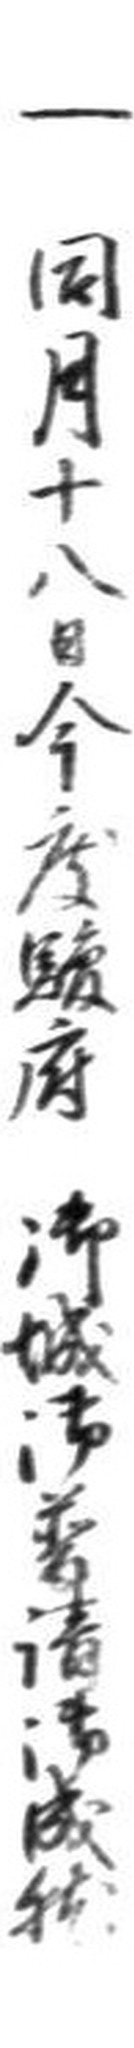一同月十八日今度駿府御城御普請御成就

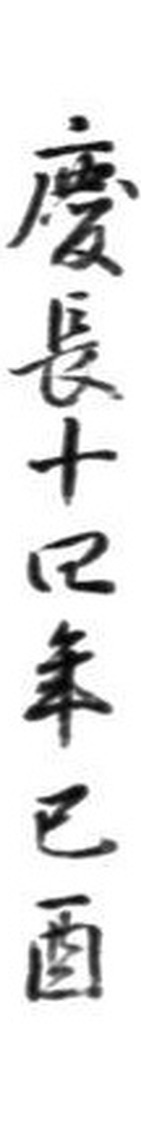慶長十四年己酉
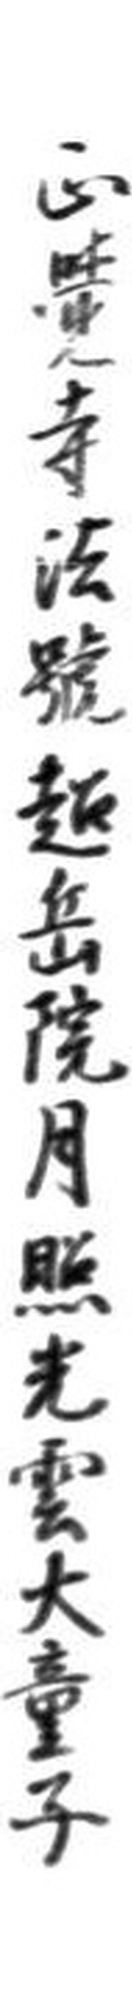正覚寺法号超岳院月照光雲大童子
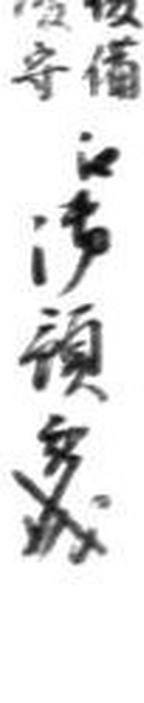後守江御預被成
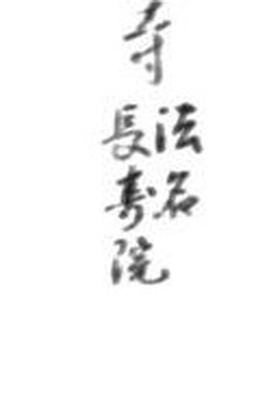長寿院
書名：家譜 二 忠直公 従文禄四年到慶安四年
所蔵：福井県文書館 Fukui Prefectural Archives
